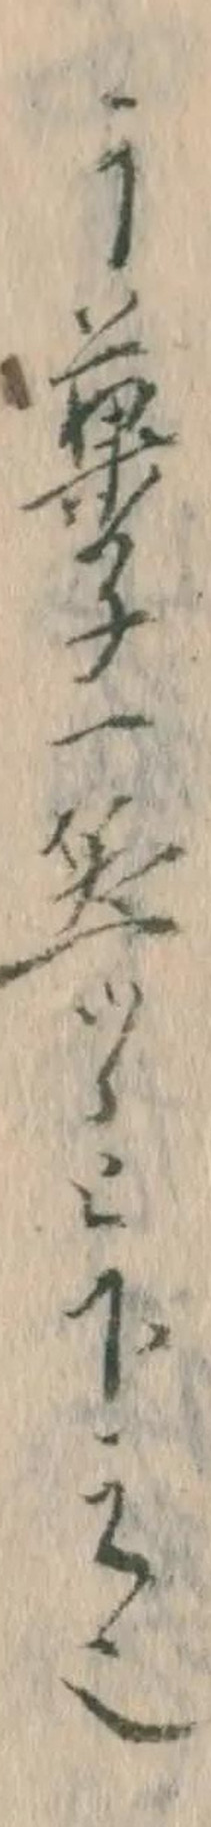干菓子一笑ツヽ被下之也
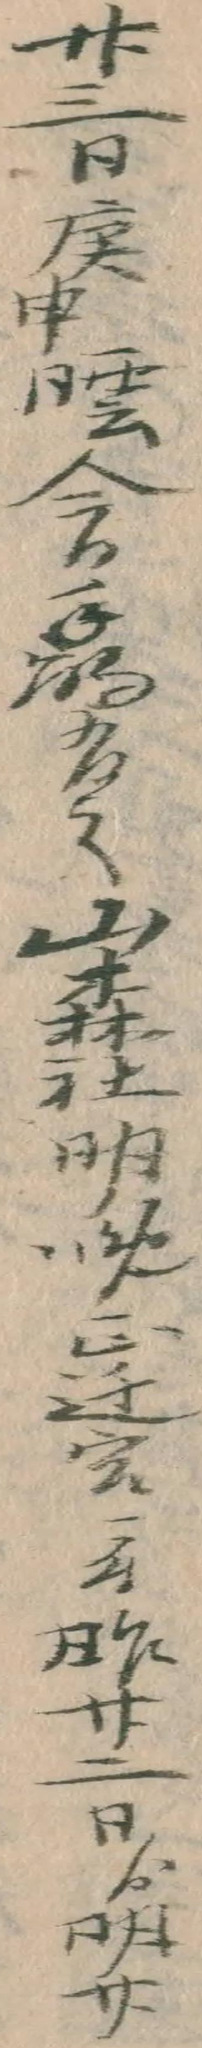廿三日庚申曇今日手觸有之山森社明晩正遷宮ニ付昨廿二日ゟ明廿
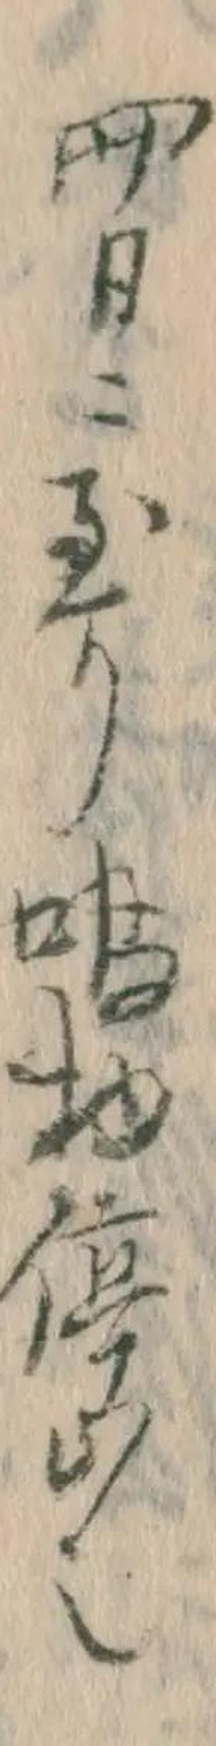四日に至り鳴物停止也
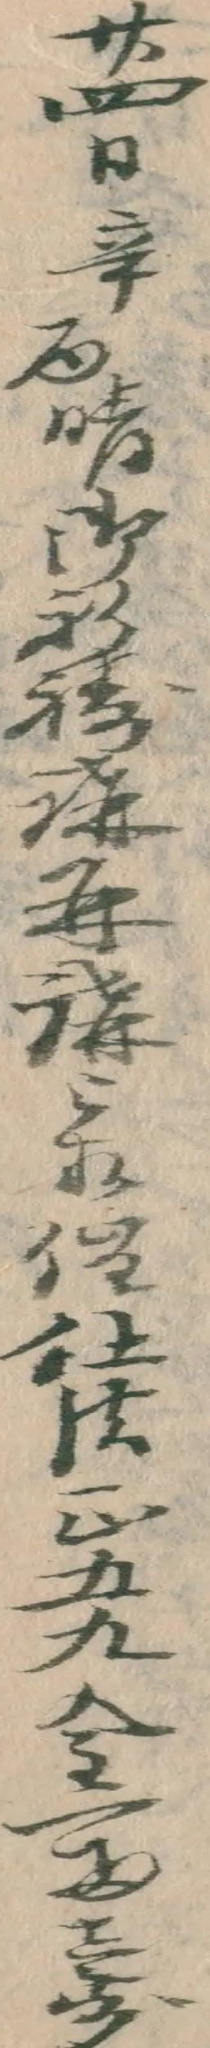廿四日辛酉晴御祈祷講再講被相催仕法正五九金一両壱歩
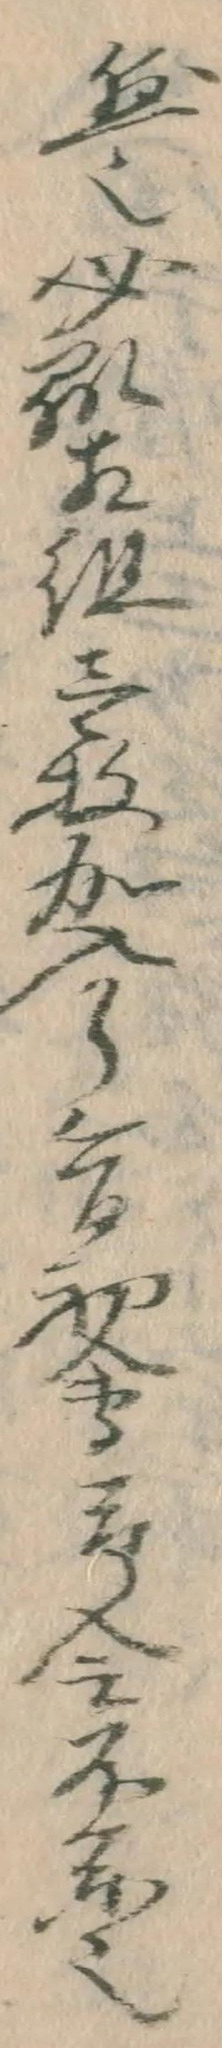懸之必顕相組壱枚加入了逃今日初會予令不参了

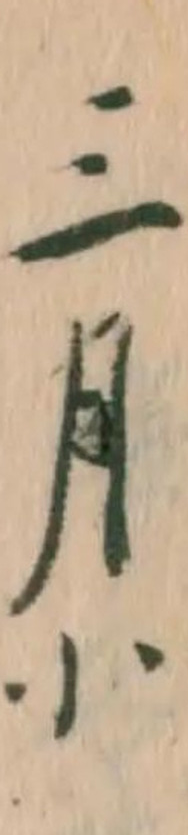三月小
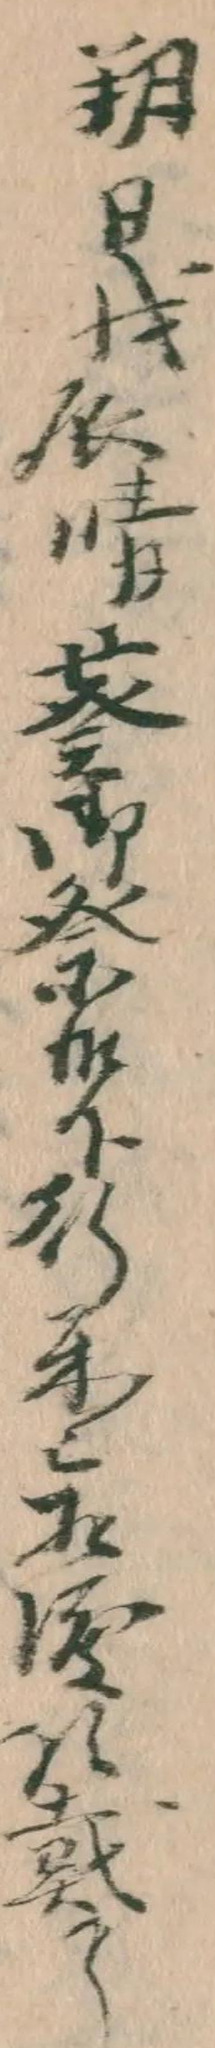朔日戊辰晴葵御祭御下行来被相渡頂戴了
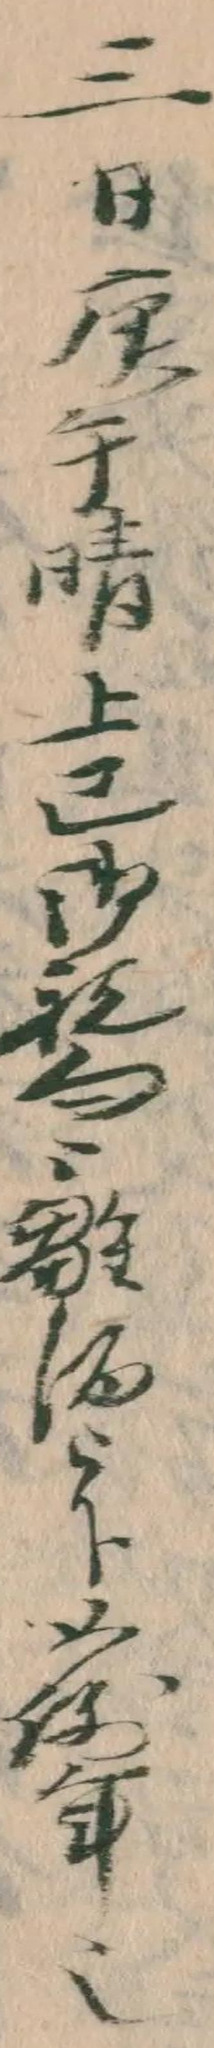三日庚午晴上巳御祝向御雛酒被下如例年也
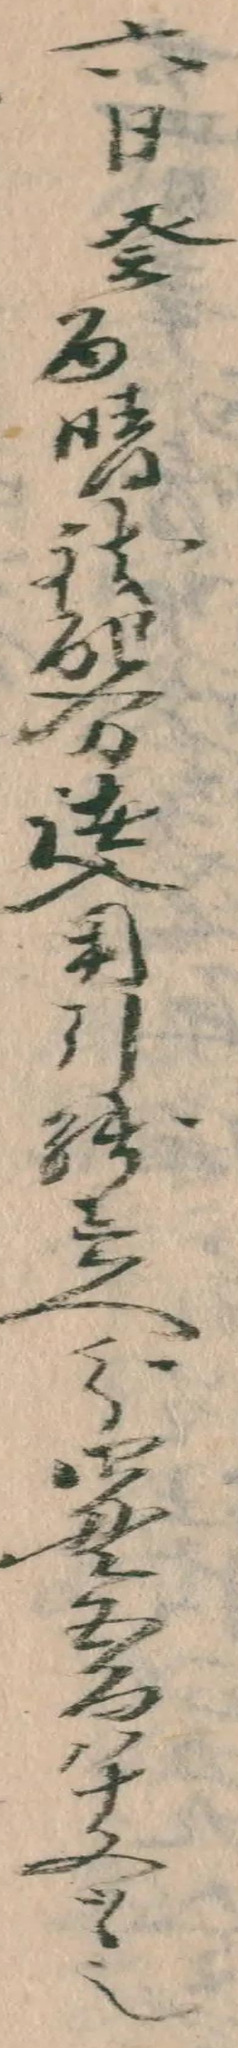六日癸酉晴残配分諸入用引残壱人分四貫五百八十文ツヽ也
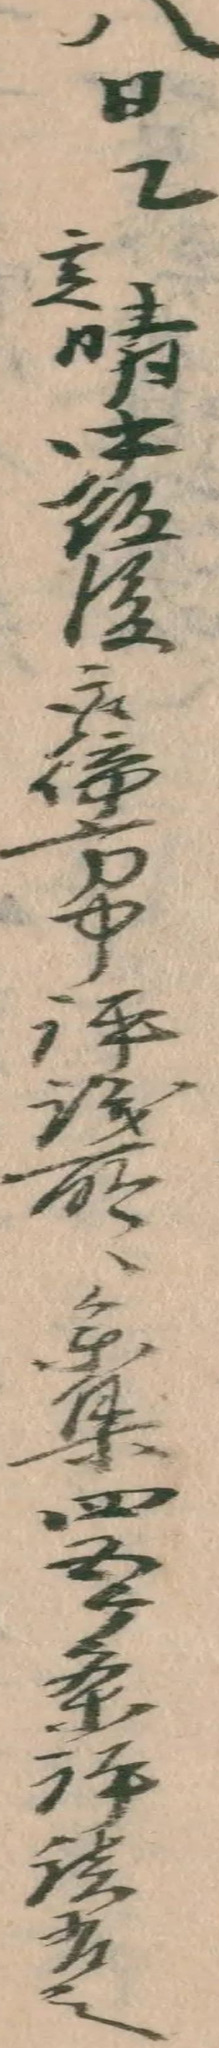八日乙亥晴中飯後取締方中評議所へ参集四五ケ条評議有之
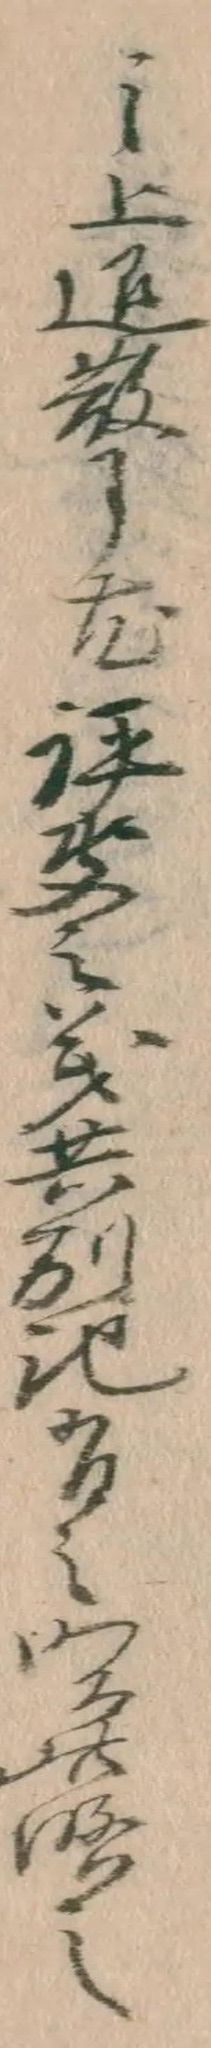之上退散了尤評決之義共別記有之仍而此畧之
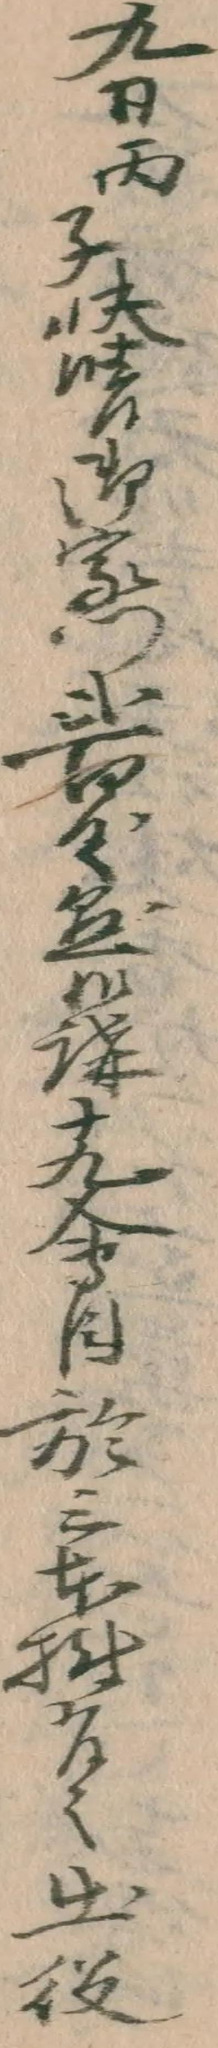九日丙子快晴御家門弐百匁懸御講十九會目於三本樹有之出役
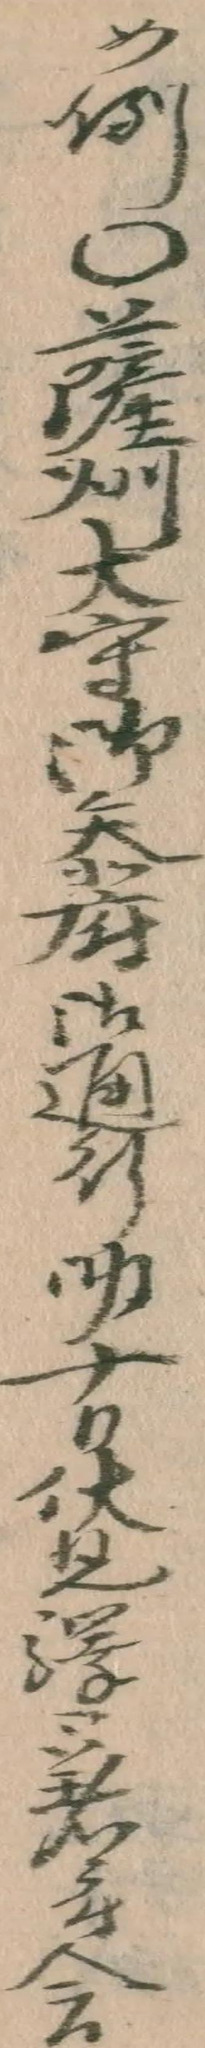如例○薩州大守御参府御通行明十日伏見驛御着ニ付今日
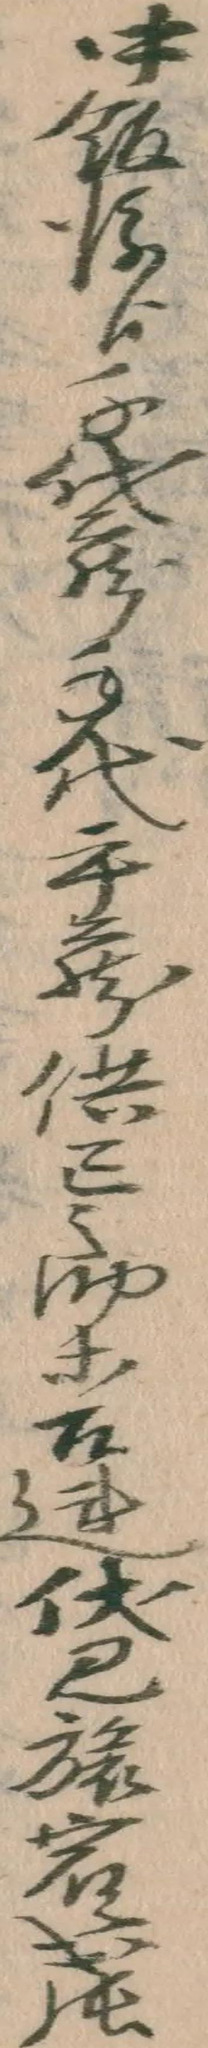中館後ゟ千代蔵手代平蔵供巳之助等召連伏見旅宿出張
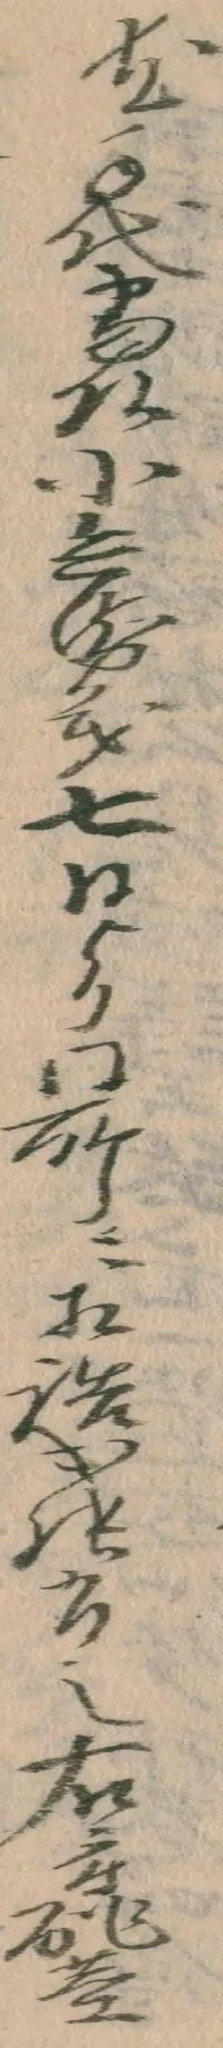尤手代番頭小兵衛義七日より同所ニ相詰出張有之右ニ付酢茎
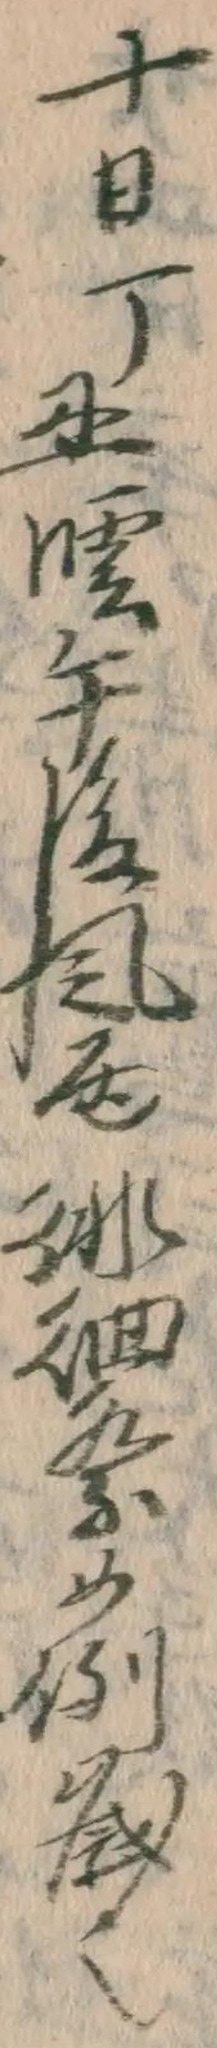十日丁丑曇午後風雨徘徊祭如例歳也
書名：賀茂社記録. 第69冊
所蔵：国立国会図書館 National Diet Library, JAPAN
